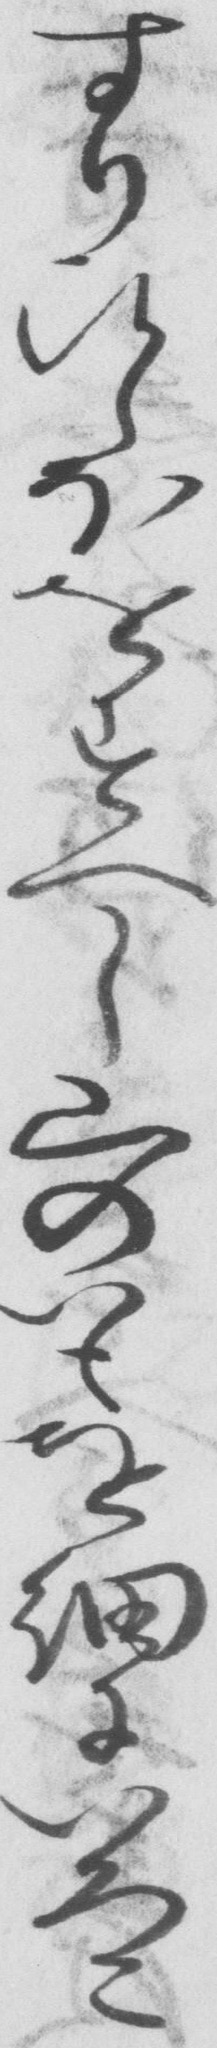すりひしほをすへし山のいもを細にいろ〳〵
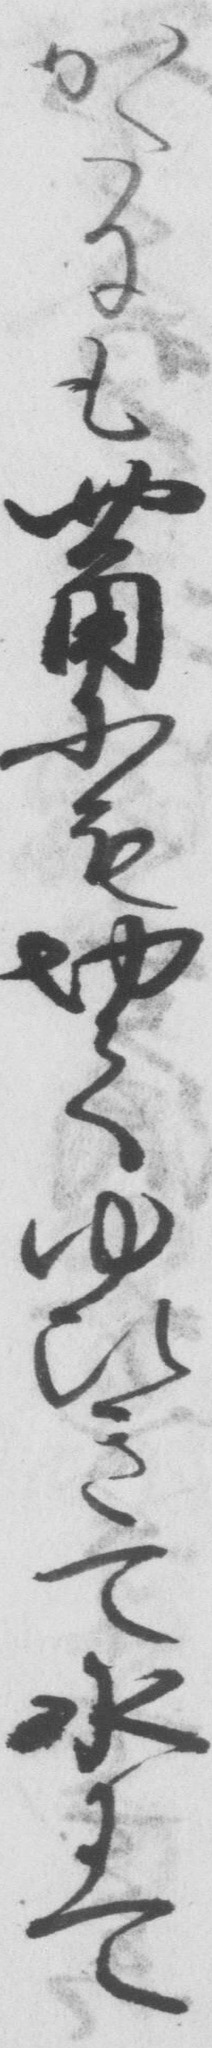かたにも四角にも切てゆひきて水にて
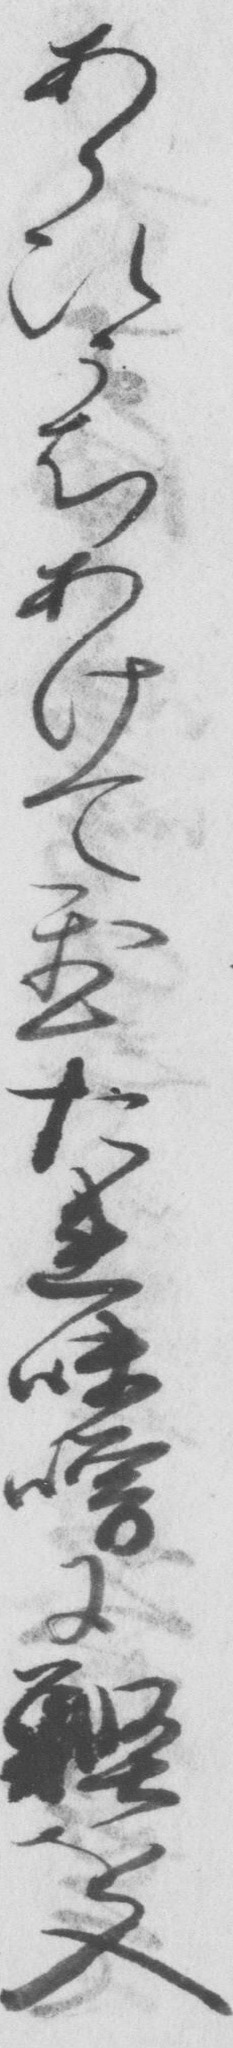あらひうちあけて置たれ味噌に鰹を入
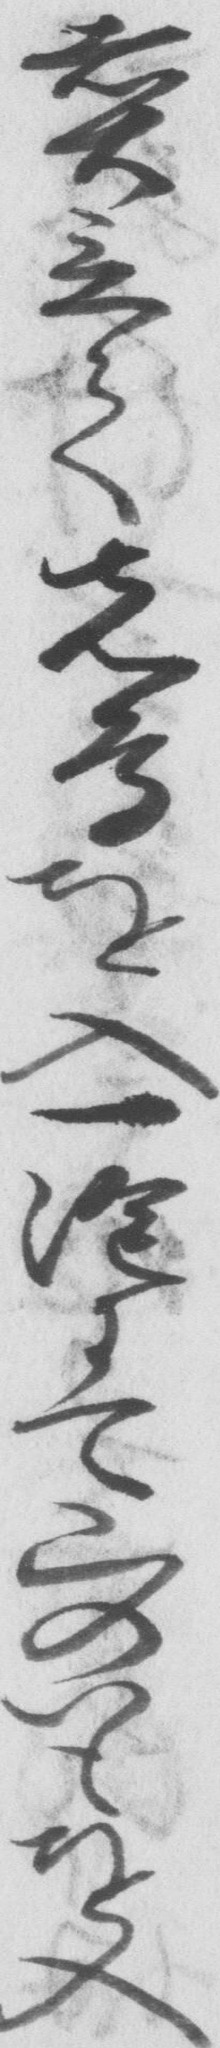煮立て先鳥を入一泡にて山のいもを入
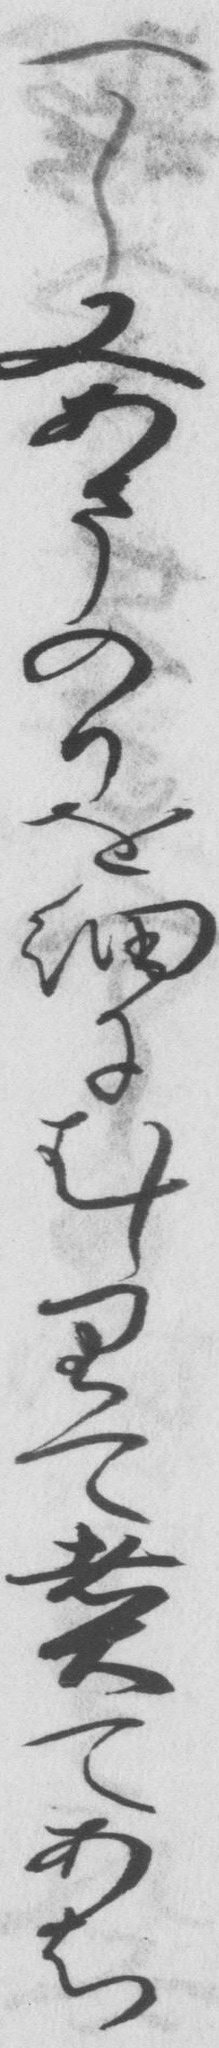へし又あさのりを細にむしりて煮てあち
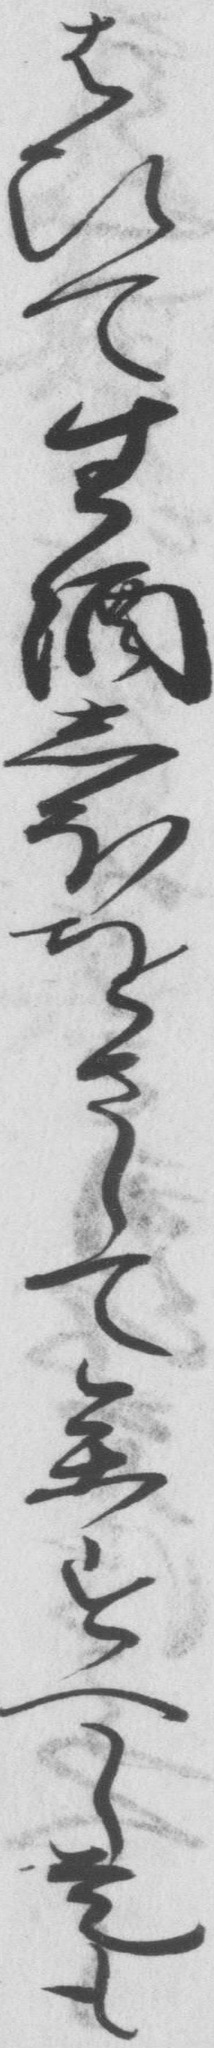はひて生酒しほをさして参すへし是も
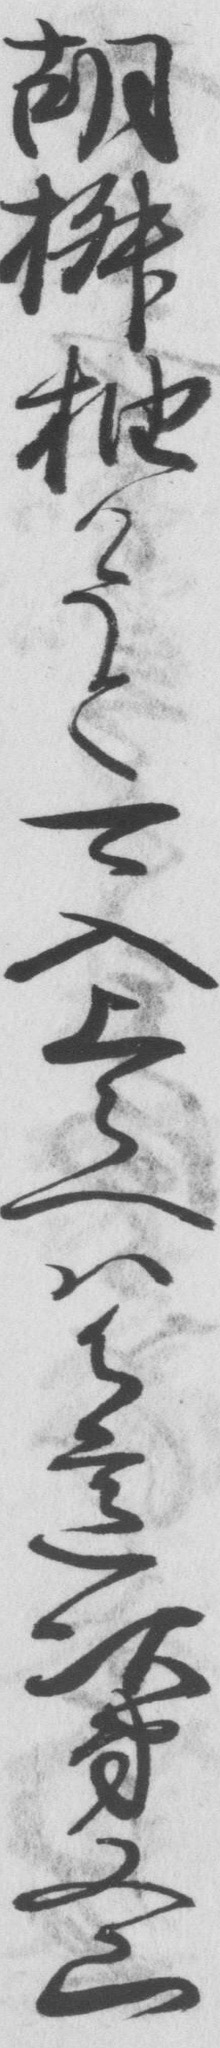胡麻柚かうと可入上候へは御意次第又山
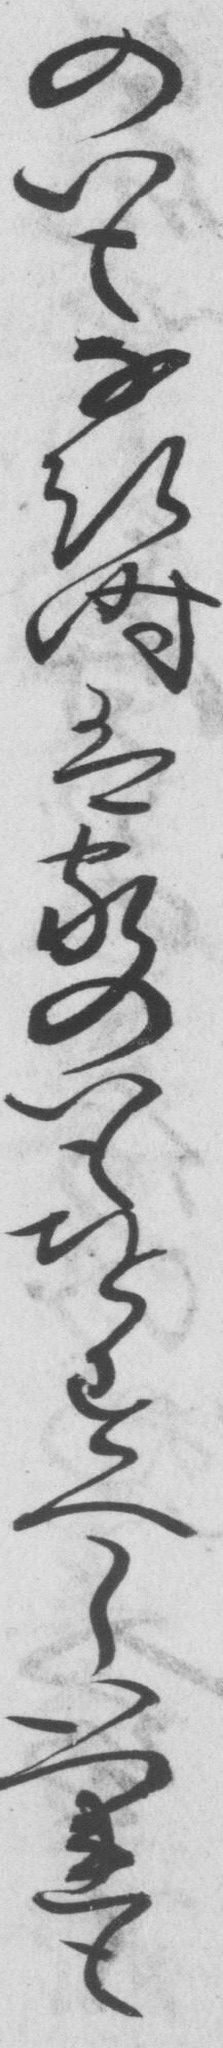のいもなき時は家のいもをすへしいつれも
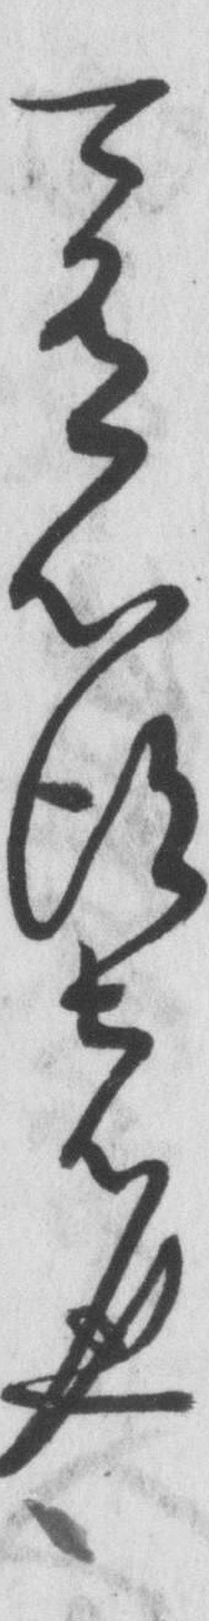可有心得者也
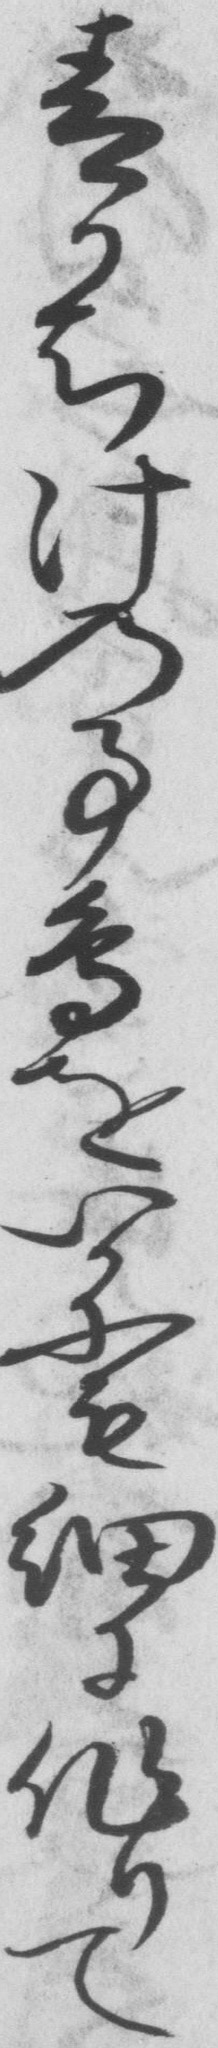一○青かち汁の事鳥をいかにも細に作りて
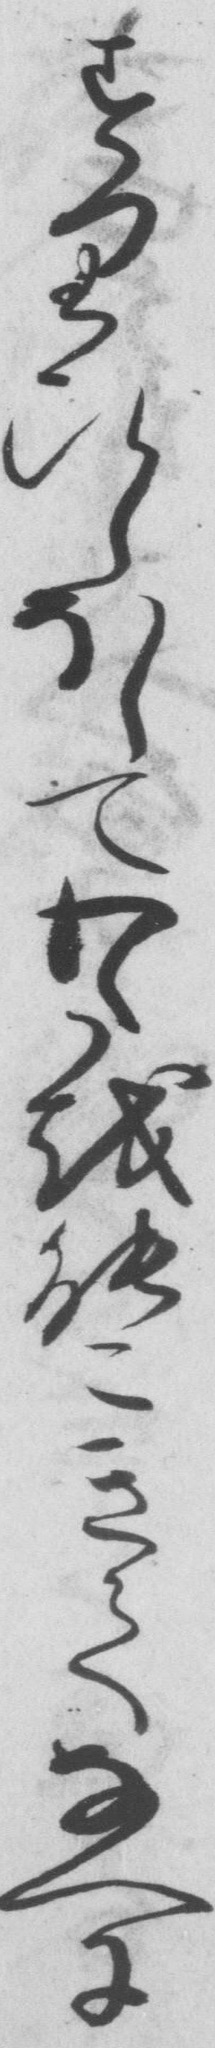すりひしほしてわたを能こきてなへに
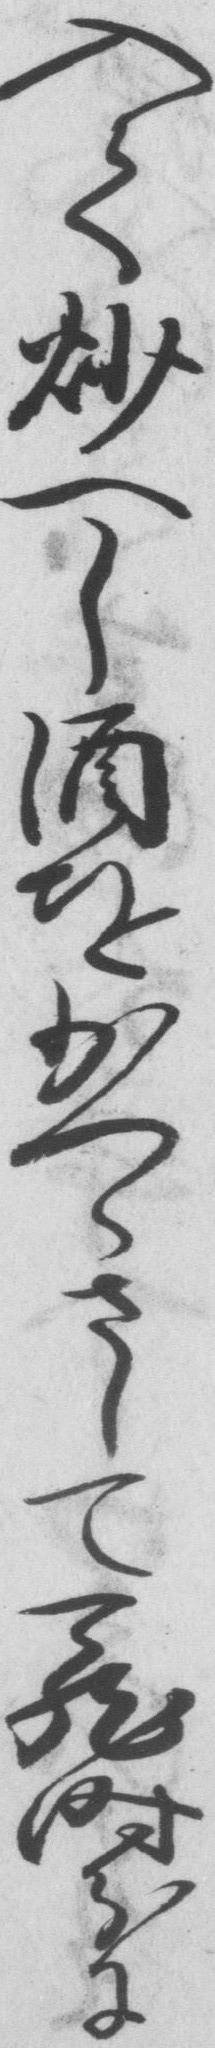入て炒へし酒を少へらさして飛時分に
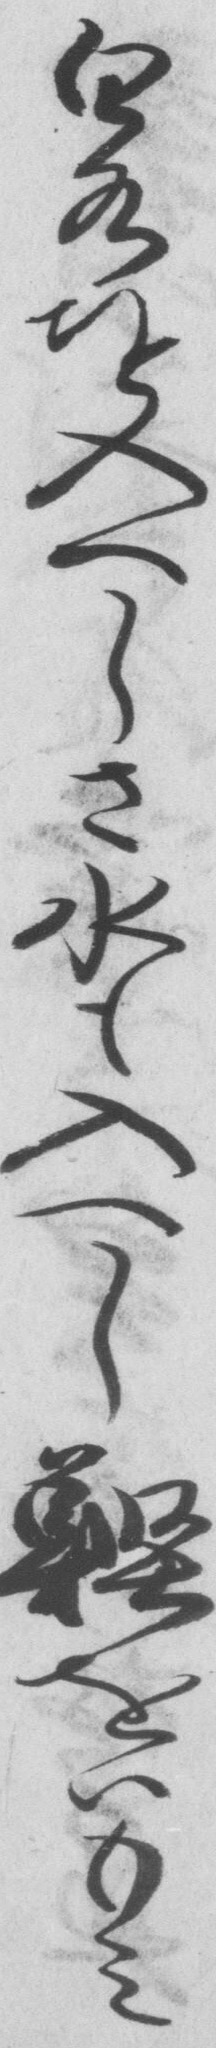白水を入へしさ水も入へし鰹をはもみ
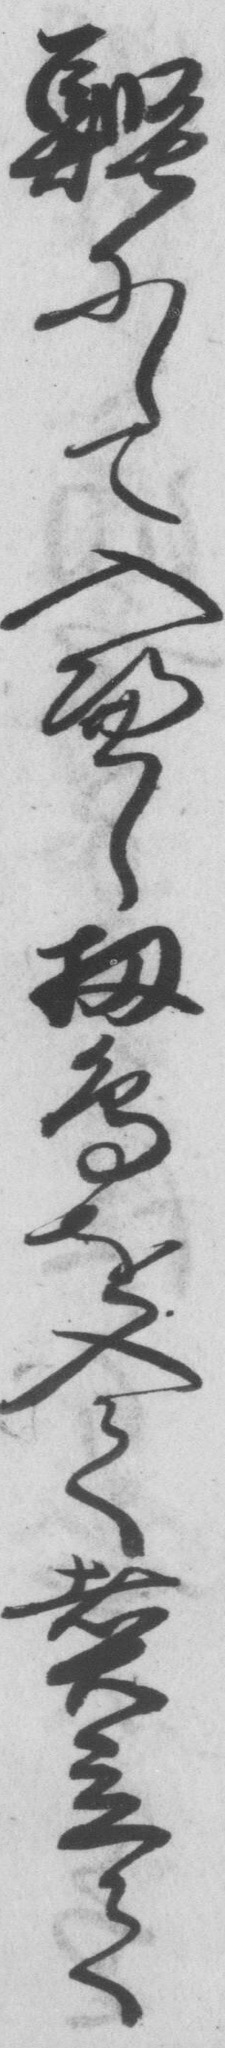鰹にして入へし扨鳥を入て煮立て
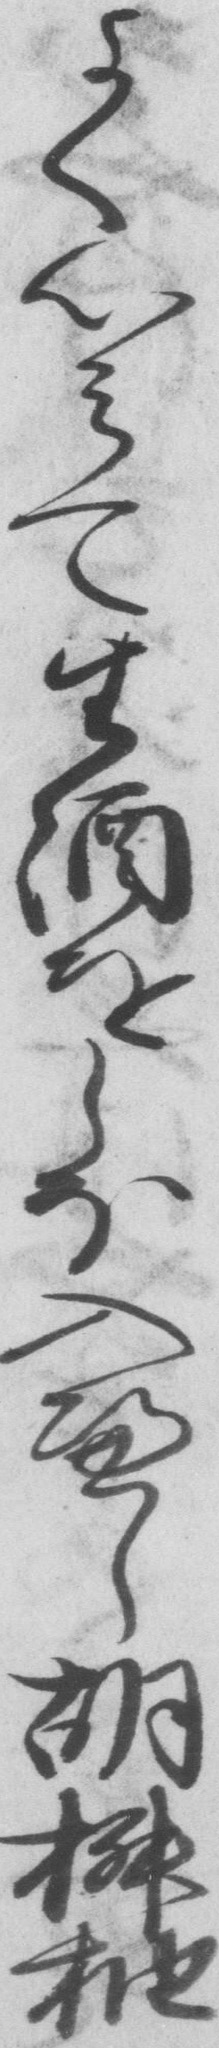よく心みて生酒をしほ入へし胡麻柚
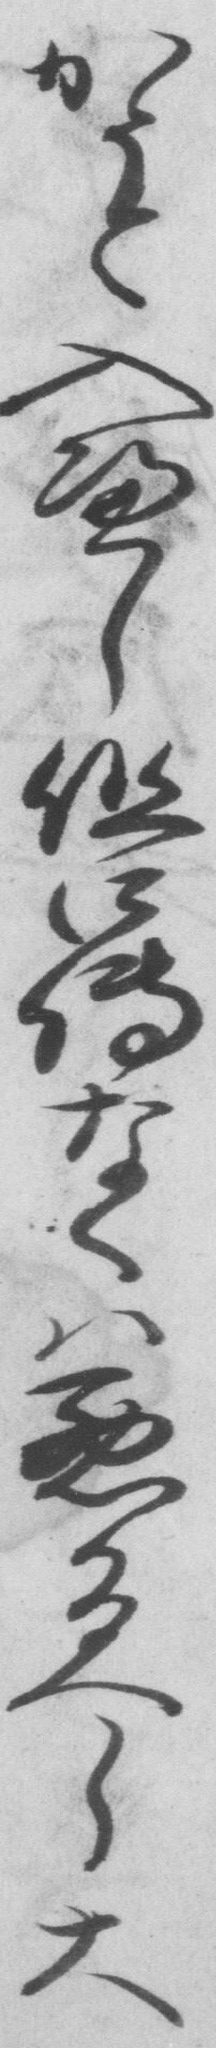かうと入へし但口伝なくは悪かるへし大
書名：料理次第
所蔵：大阪府立大学学術情報センター 国文学研究資料館
